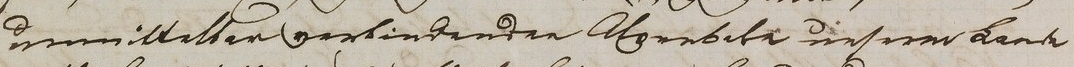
unmittelbar verbindenden Alpenbahn unserm Lande
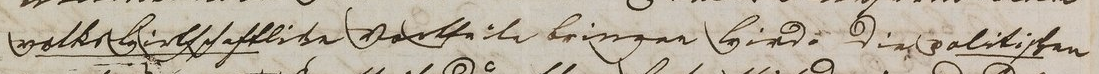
volkswirthschaftliche Vortheile bringen wird. Die politischen
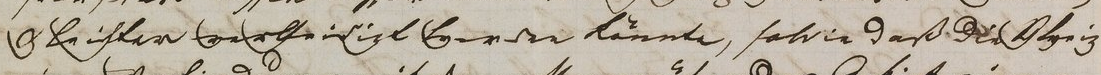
& leichter vertheidigt werden könnte, sowie daß die Schweiz
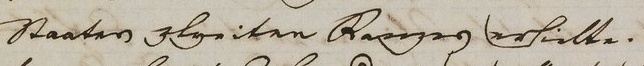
Staates zweiten Ranges erhielte.
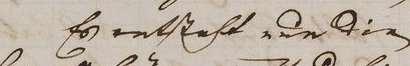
Es entsteht nun die
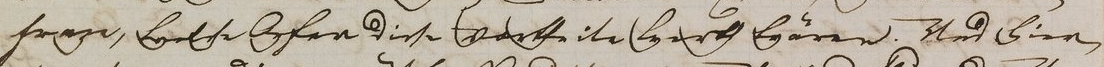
Frage, welche Opfer diese Vortheile werth wären. Und hier
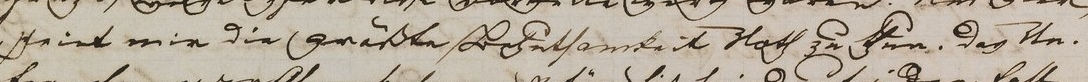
scheint mir die größte Behutsamkeit Noth zu thun. Das Un-
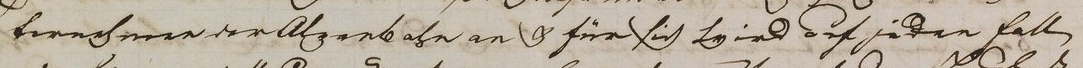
ternehmen der Alpenbahn an & für sich wird auf jeden Fall
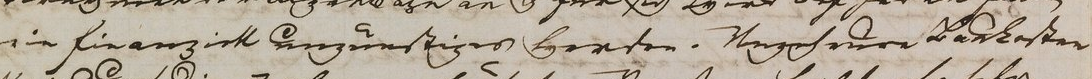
ein finanziell ungünstiges werden. Ungeheure Baukosten
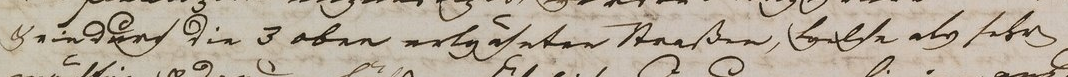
& ein durch die 3 oben erwähnten Straßen, welche als sehr
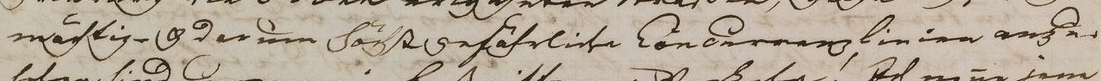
mächtige & darum höchst gefährliche Concurrenzlinien anzu-
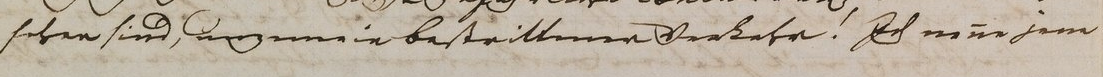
sehen sind, ungemein bestrittener Verkehr! Ich nenne jene
